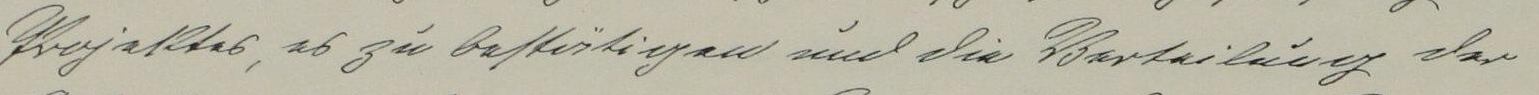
Projektes, es zu bestätigen und die Verteilung der
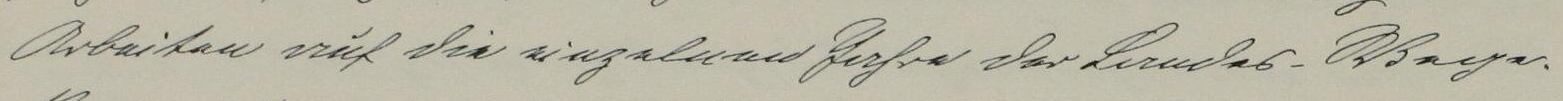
Arbeiten auf die einzelnen Jahre der Landes-Wege-
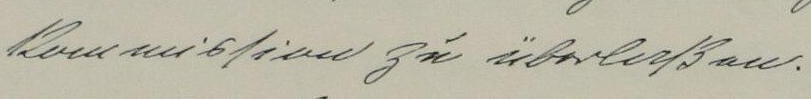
kommission zu überlaßen.
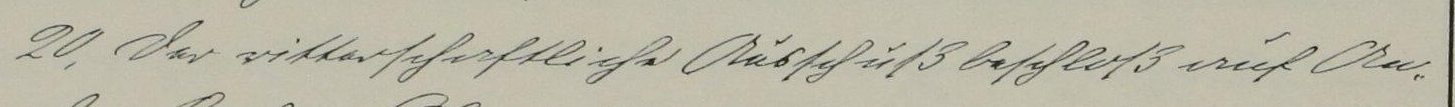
20. Der ritterschaftliche Ausschuß beschloß auf An-
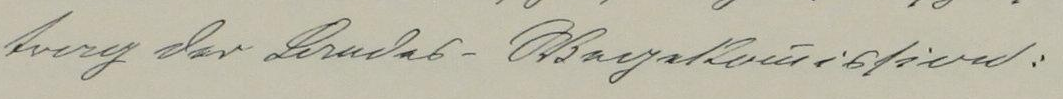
trag der Landes-Wegekommission:
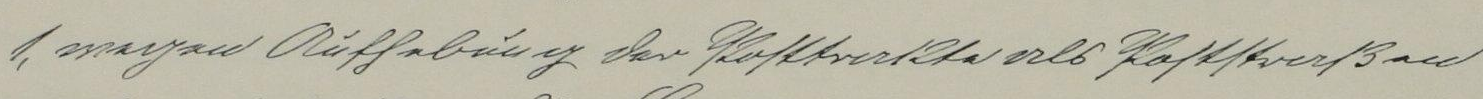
1. wegen Aufhebung der Posttrakte als Poststraßen
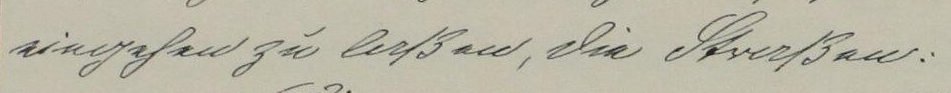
eingehen zu lassen, die Straßen:
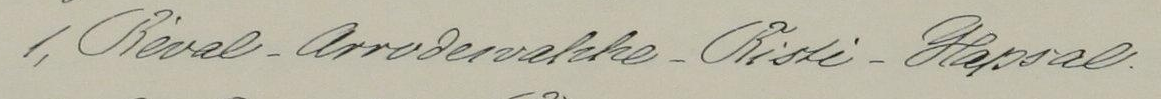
1. Reval-Arrodewahhe-Risti-Hapsal
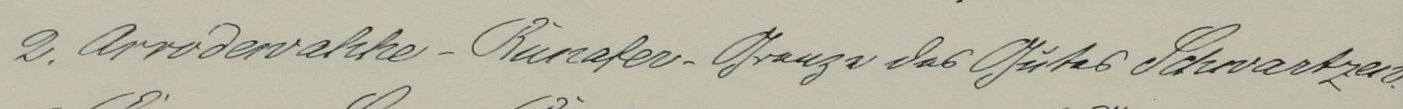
2. Arrodewahhe-Runafer-Grenze des Gutes Schwartzen
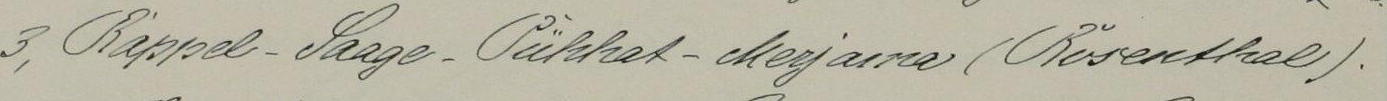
3. Rappel-Saage-Pühhat-Merjama (Rosenthal).
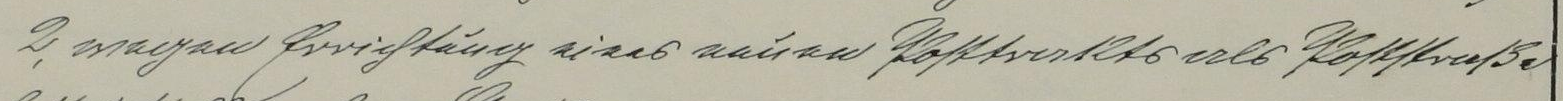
2. wegen Errichtung eines neuen Posttrakts als Poststraße
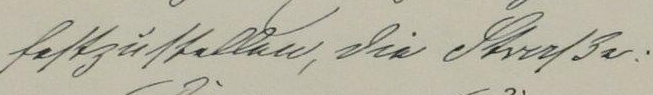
festzustellen, die Straße:
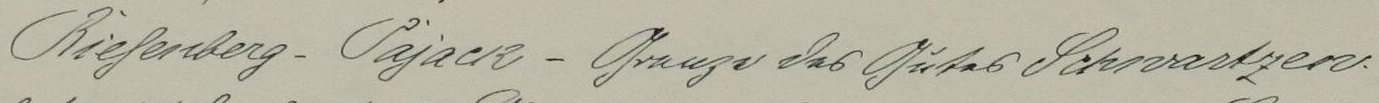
Riesenberg-Pajack-Grenze des Gutes Schwartzen.
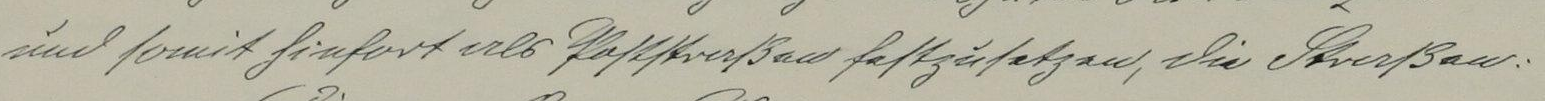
und somit hinfort als Poststraßen festzusetzen, die Straßen:
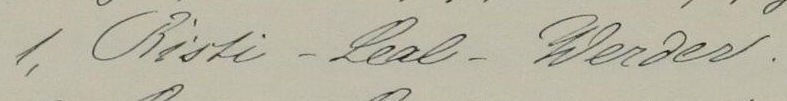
1. Risti-Leal-Werder
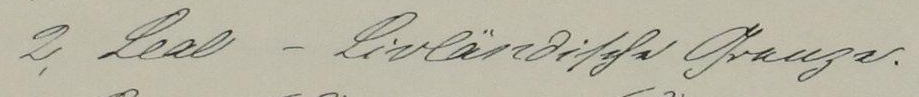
2. Leal-Livländische Grenze
